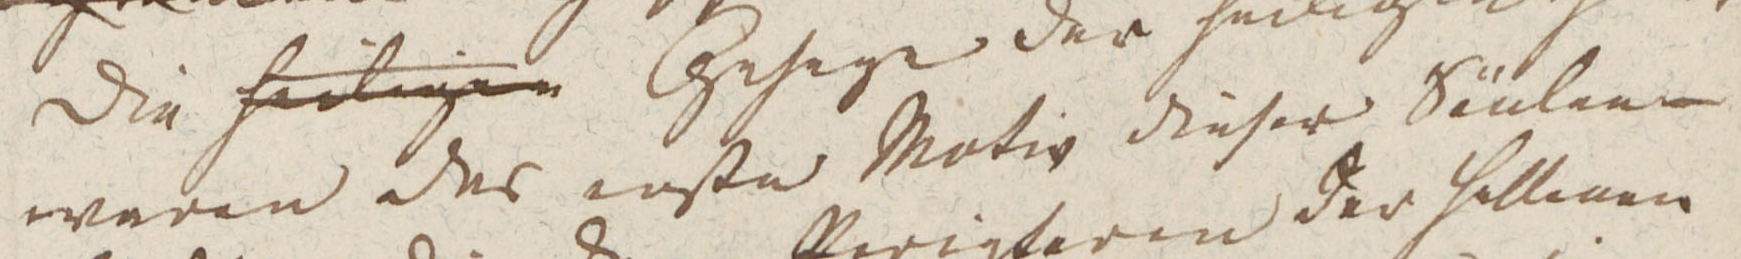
waren das erste Motiv dieser Säulen-
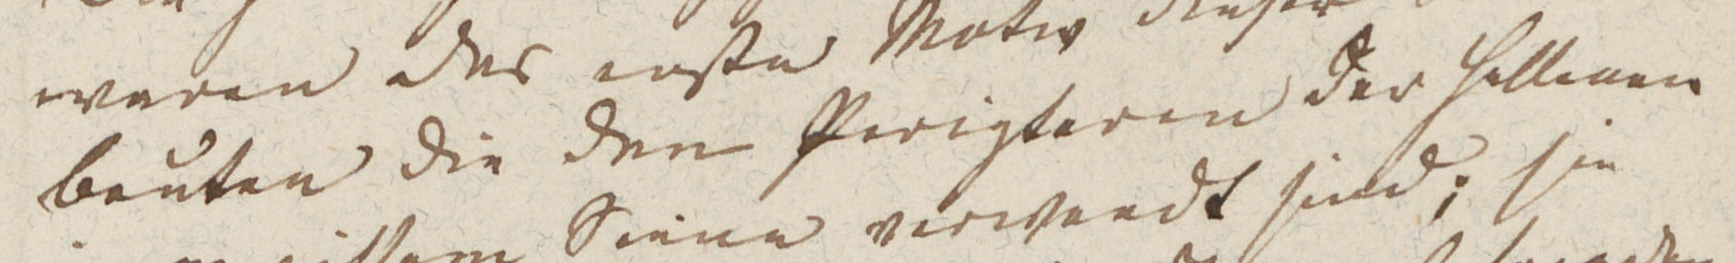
bauten die den Peripteren der Hellenen
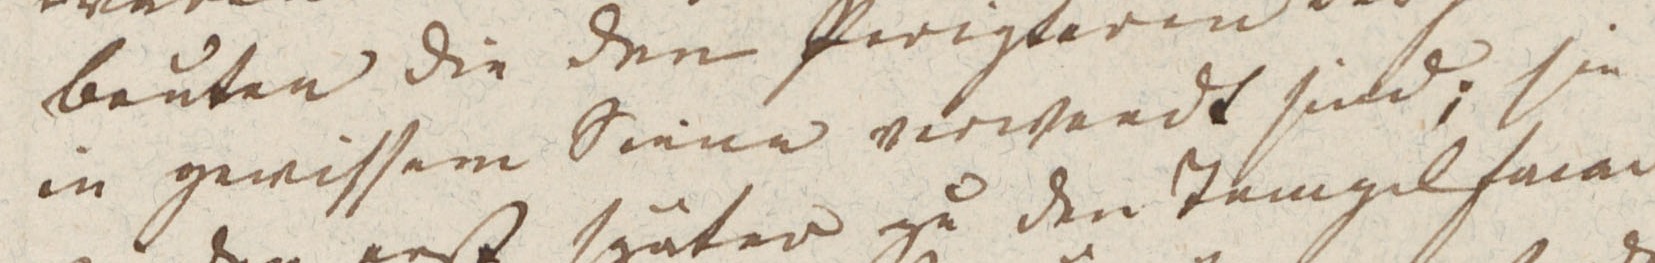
in gewissem Sinne verwandt sind; sie
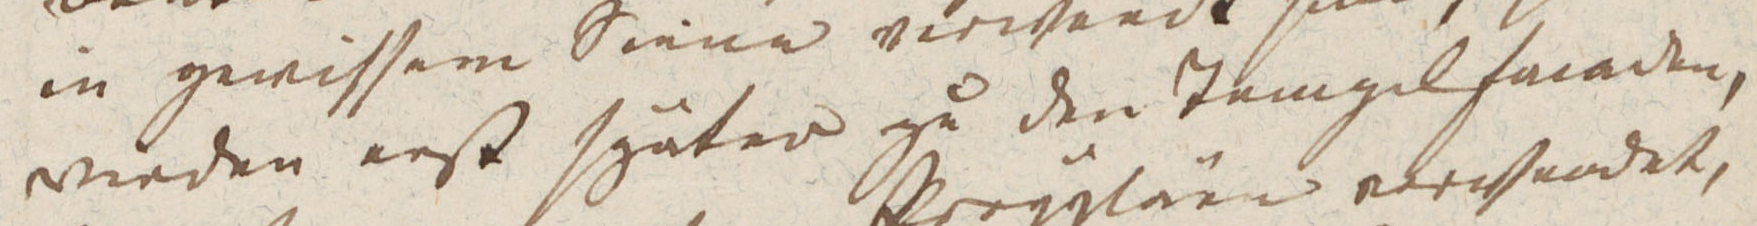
wurden erst später zu den Tempelfacaden,
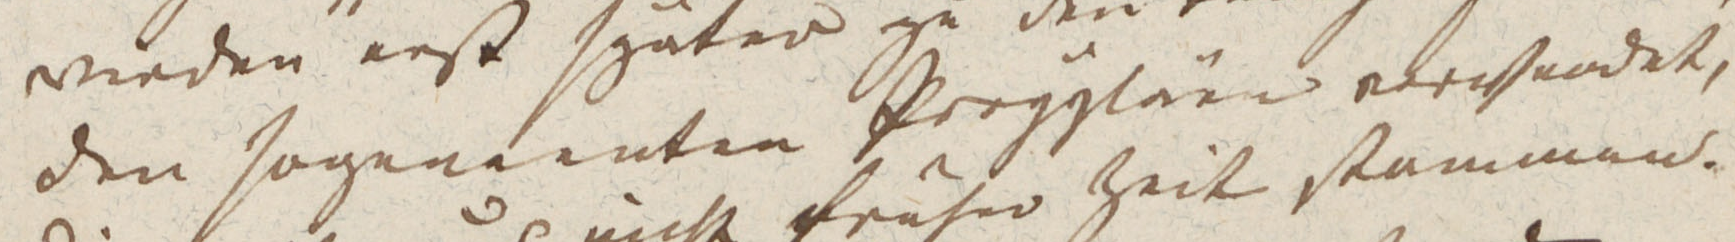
den sogenannten Propyläen verwendet,
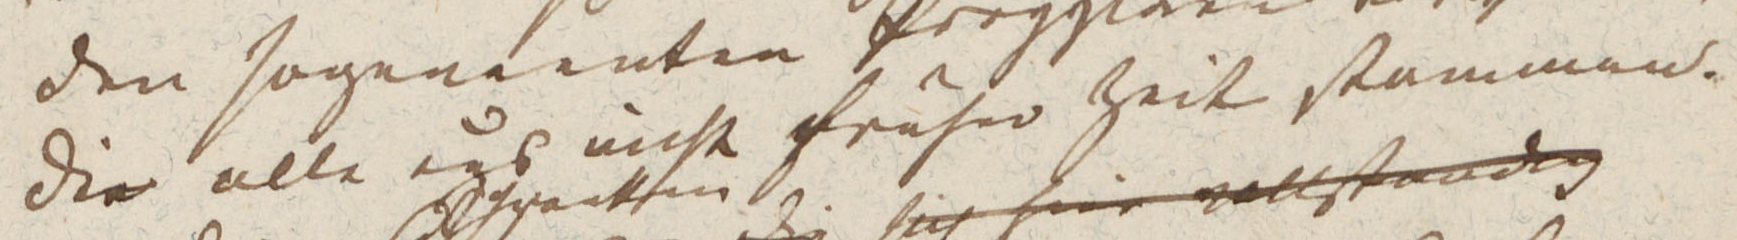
die alle aus nicht früher Zeit stammen.
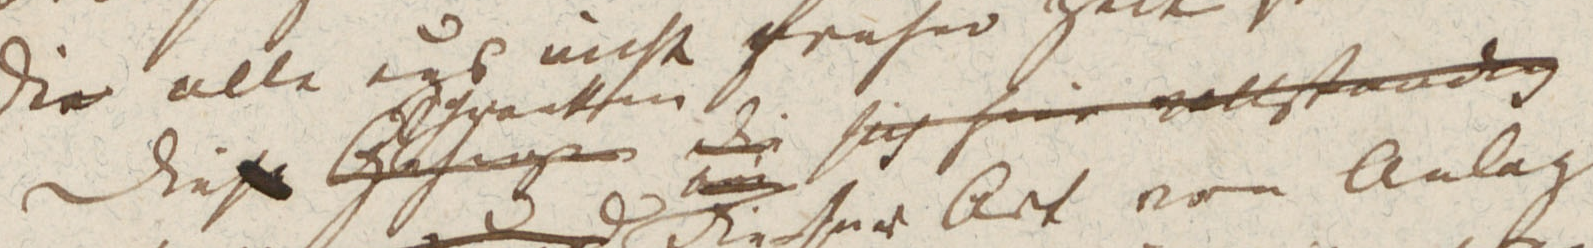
Diese Gehege Schranken die sich hier vollstandig
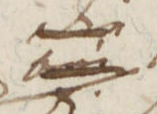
welche bei
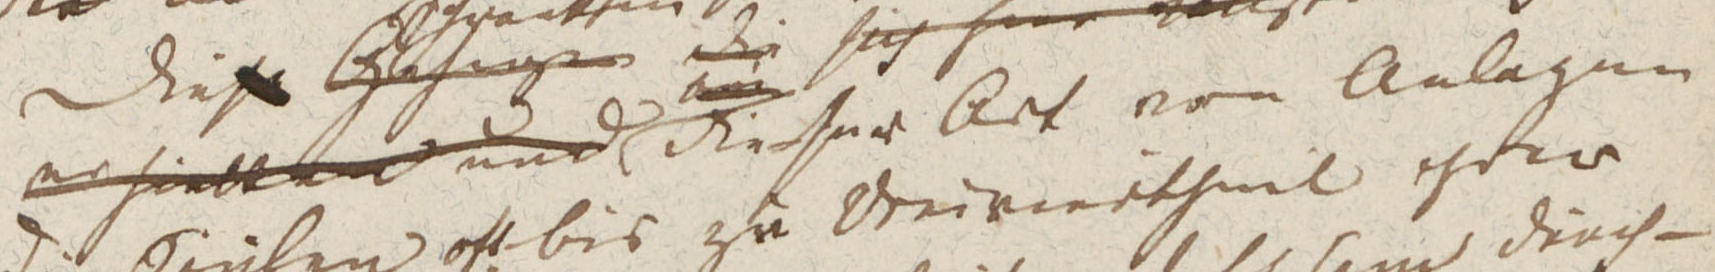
erhielten und bei dieser Art von Anlagen
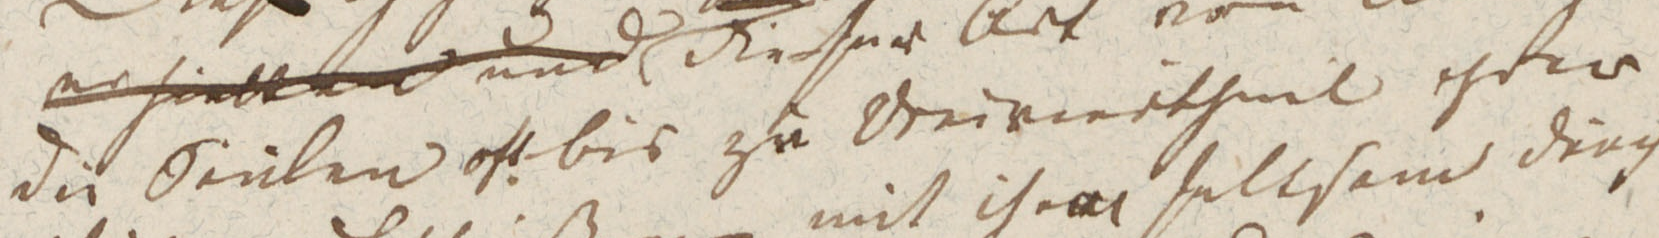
die Säulen oft bis zu Dreiviertheil ihrer
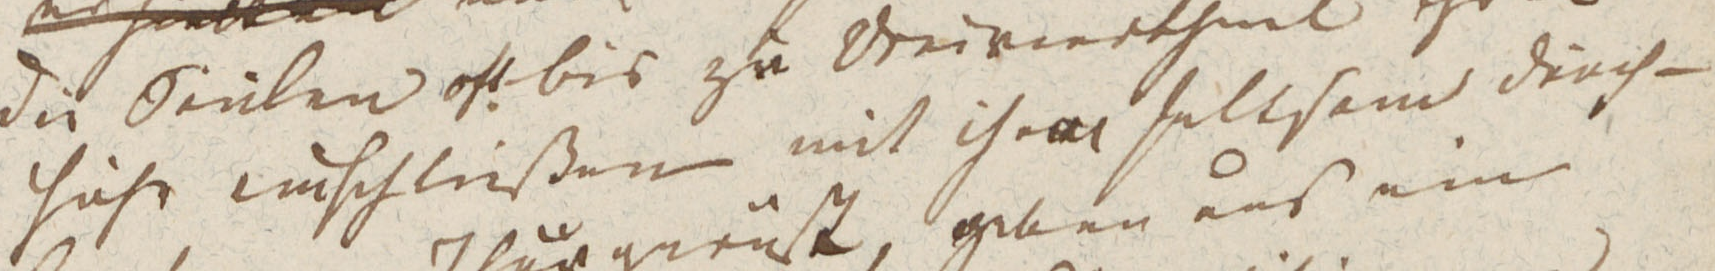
Höhe einschliessen mit ihrrm seltsam durch-
